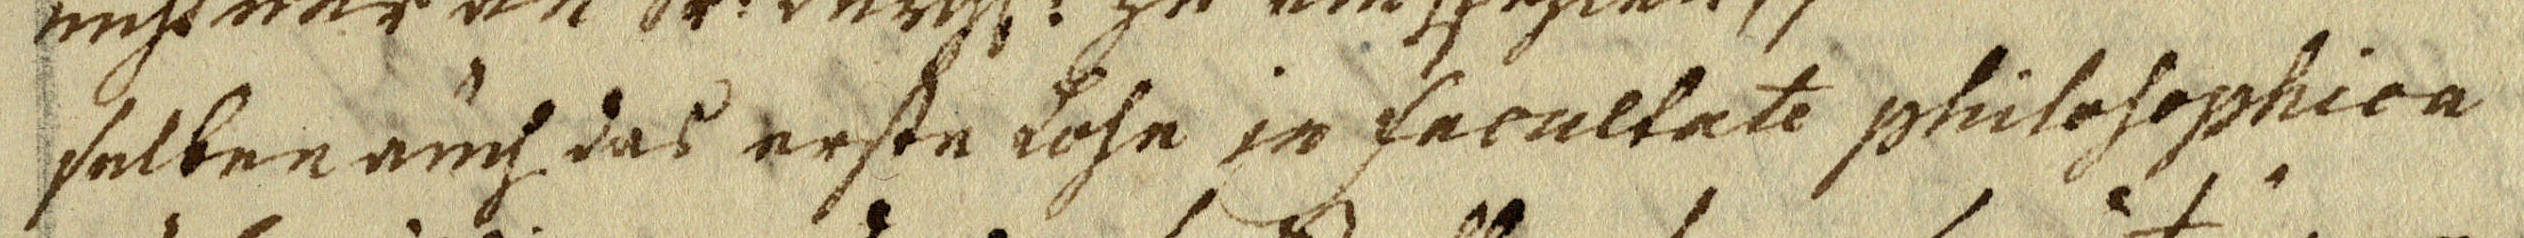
selben auch das erste Lohn in Facultate philosophica
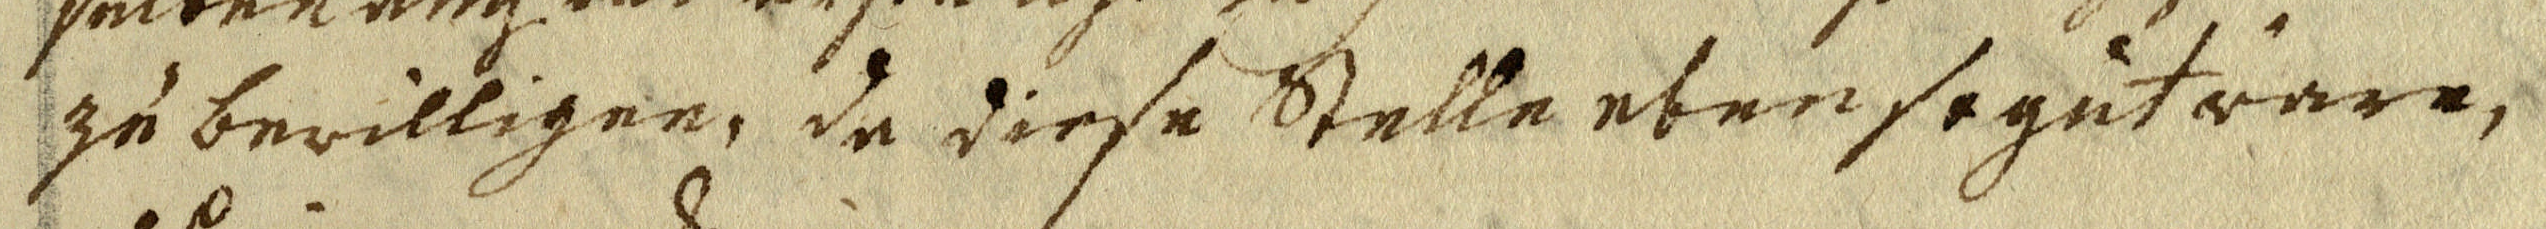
zu bewilligen, da diese Stelle ebenso gut wäre,
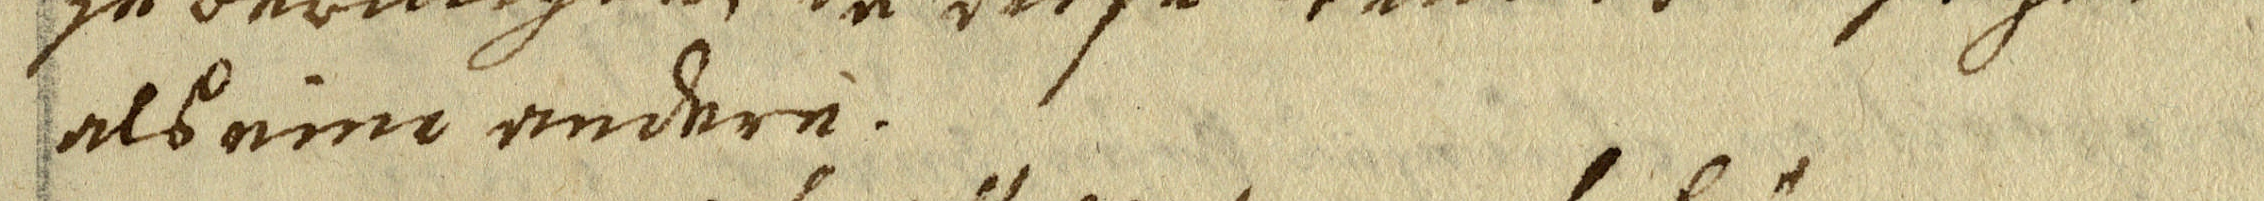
als eine andere.
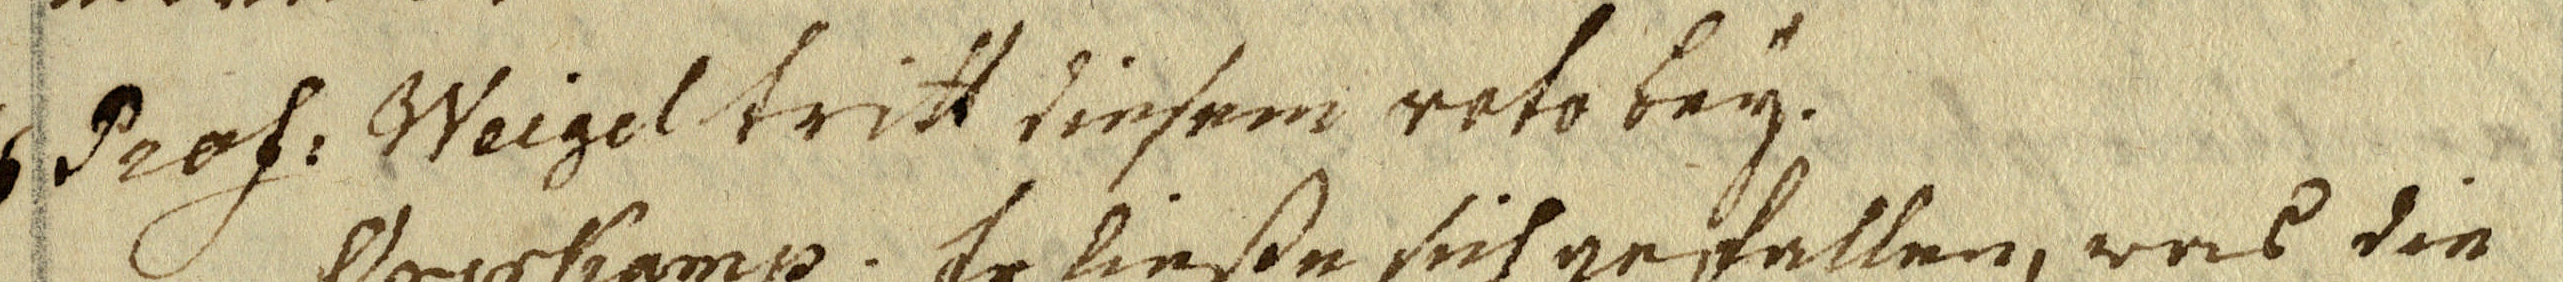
dh Prof. Weigel tritt diesem voto beÿ.
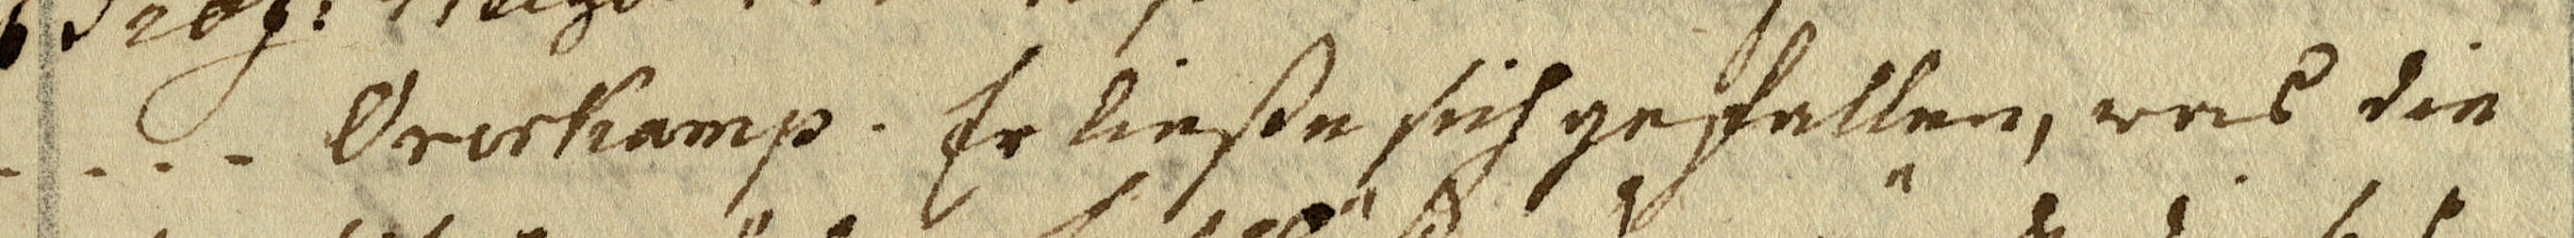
Overkamp. Er ließe sich gefallen, was die
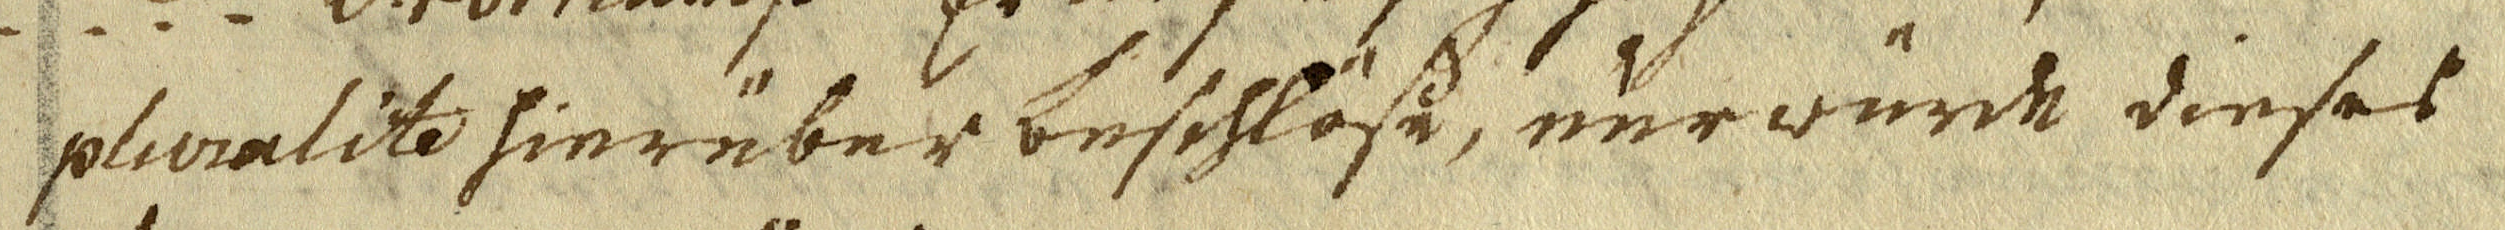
pluralite hierüber beschlöße, nur würde dieses
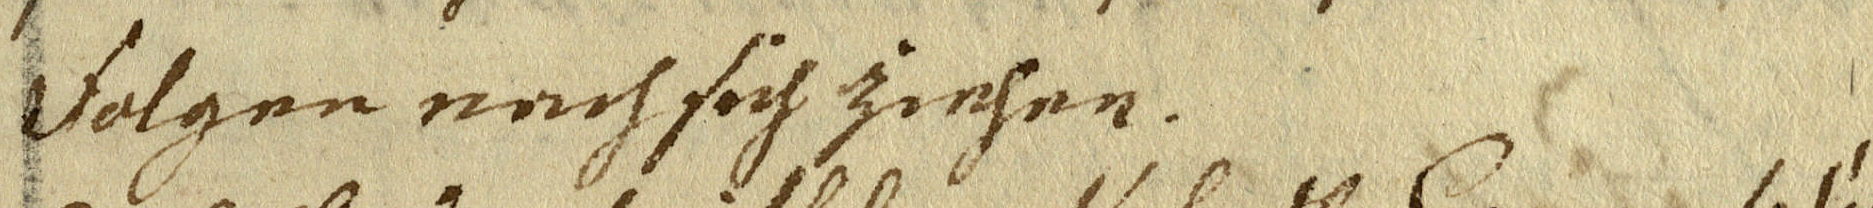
Folgen nach sich ziehen.
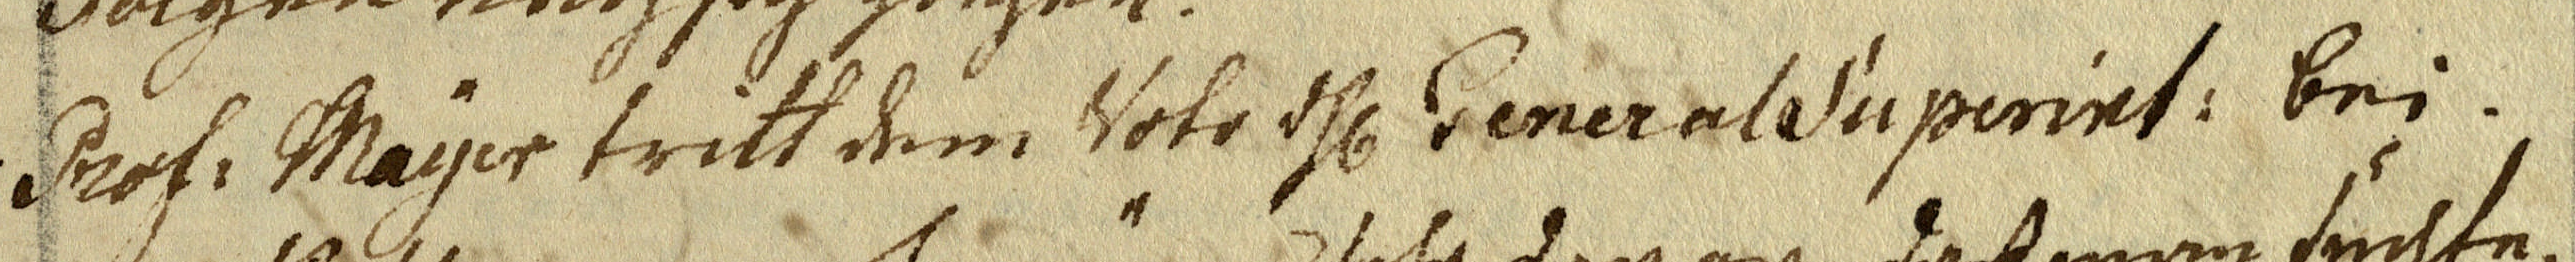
dh Prof. Maÿer tritt dem Voto dh GeneralSuperint. bei.
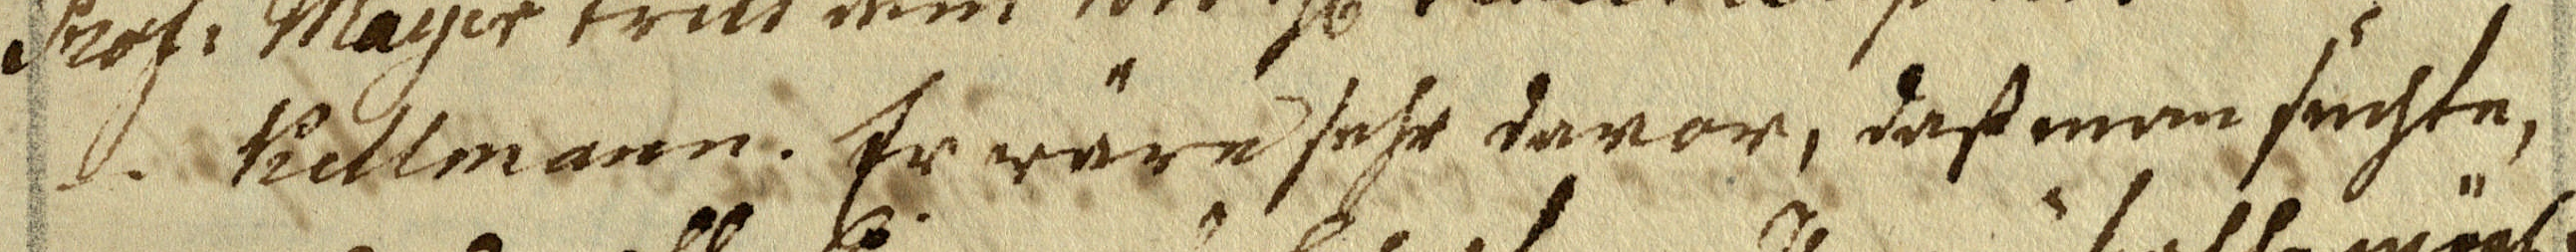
Kellmann. Er wäre sehr davor, daß man suchte,
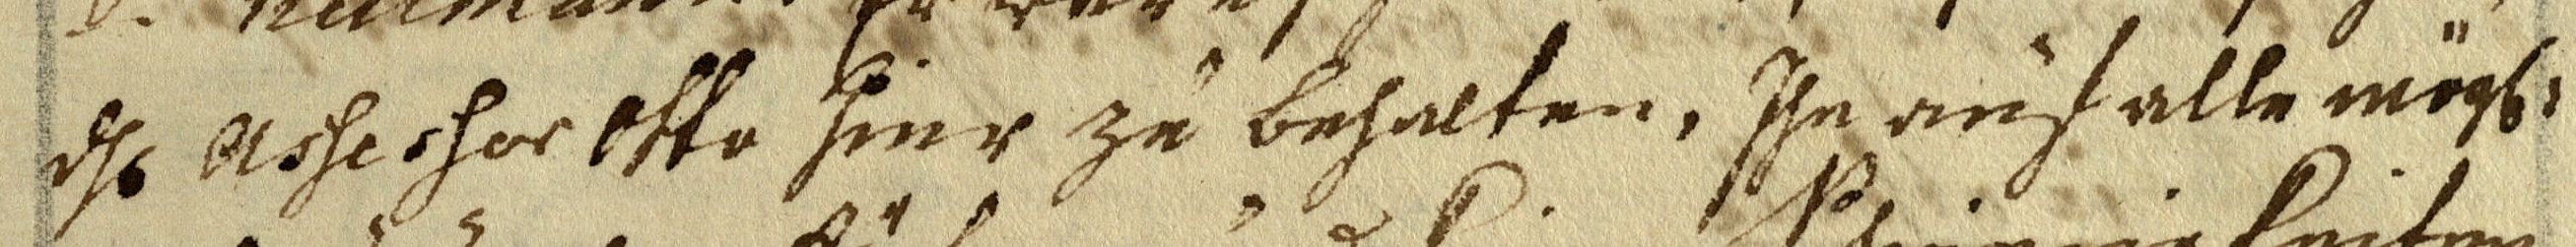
dh Assessor Otto hier zu behalten. Ihn auf alle mögl.
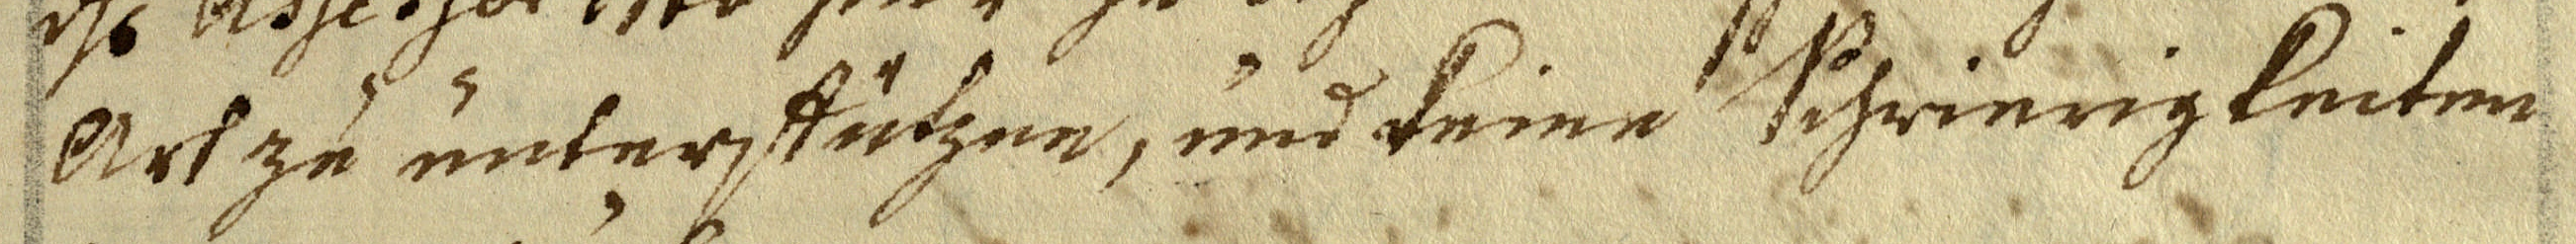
Art zu unterstützen, und keine Schwierigkeiten
